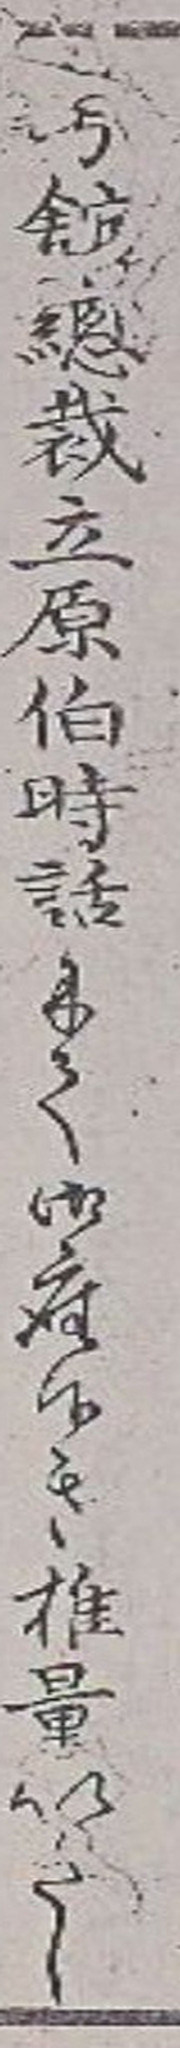考館総裁立原伯時話にて御座候き推量いたし
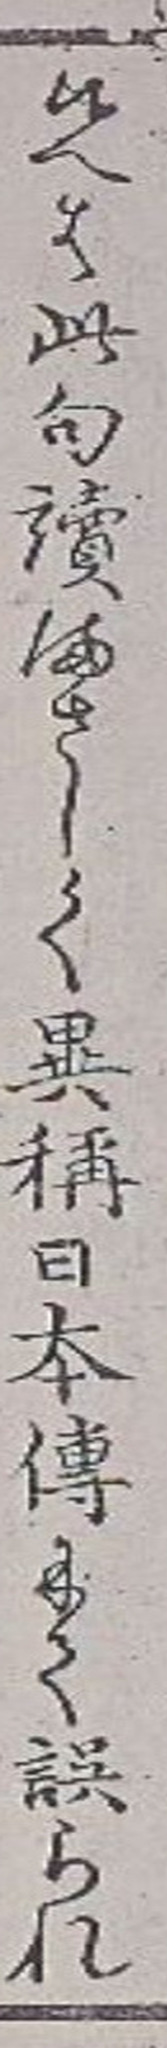候へは此句読まさしく異称日本伝にて誤られ
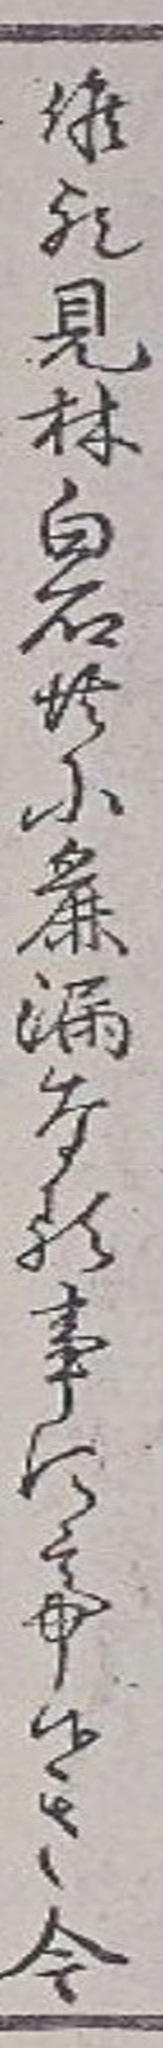候歟見林白石共に麁漏なる事にて候き今
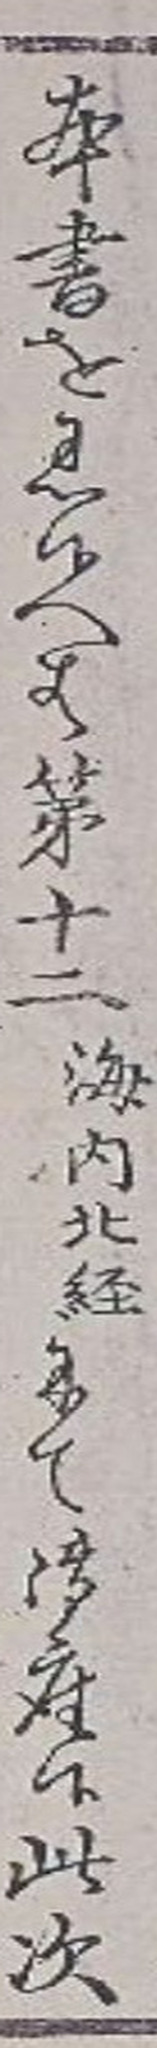本書を見候へは第十二海内北経にて御座候此次
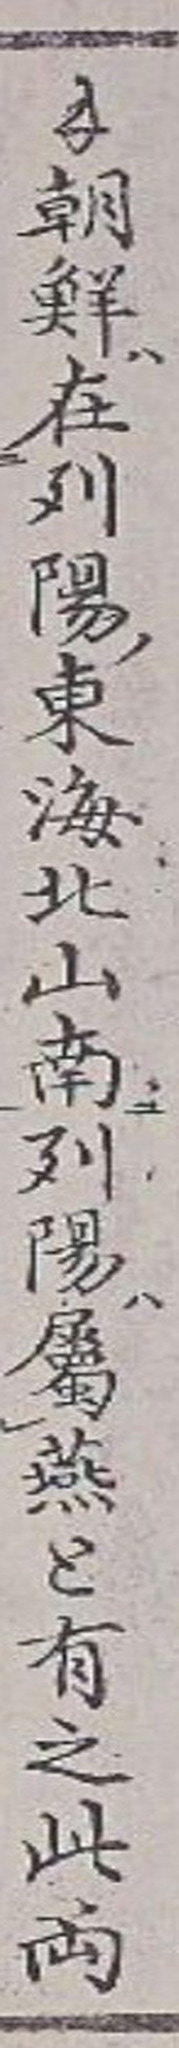に朝鮮在列陽東海北山南列陽属燕と有之此両
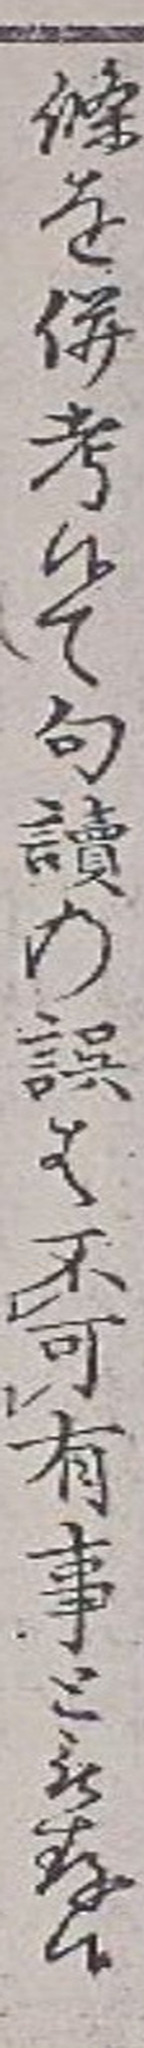条を併考候て句読の誤は不可有事と被存候
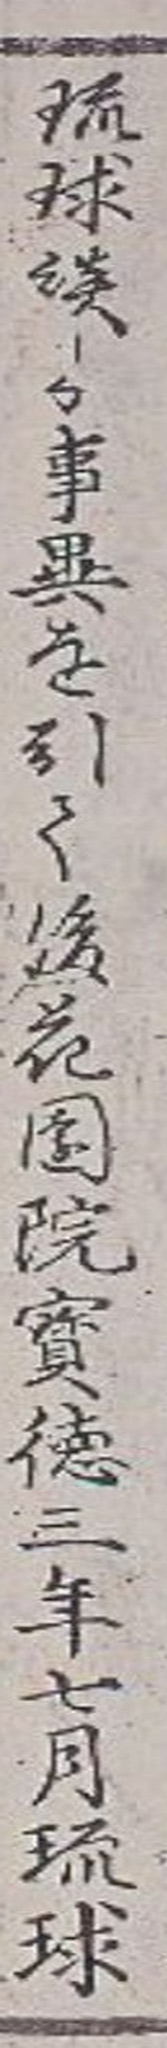琉球談事異を引て後花園院宝徳三年七月琉球
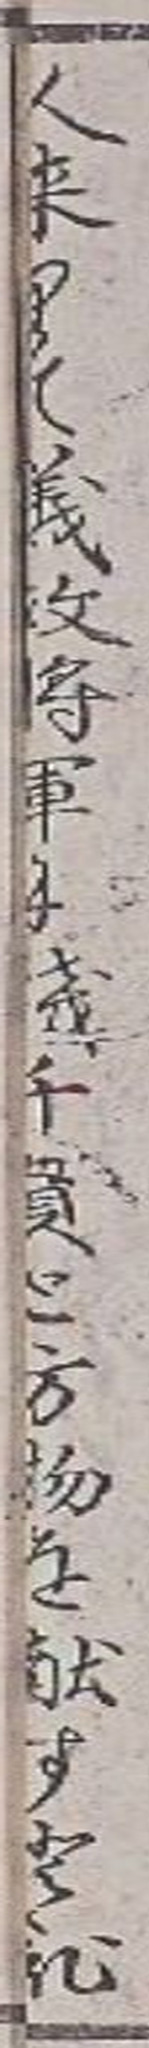人来りて義政将軍に銭千貫と方物を献すと記
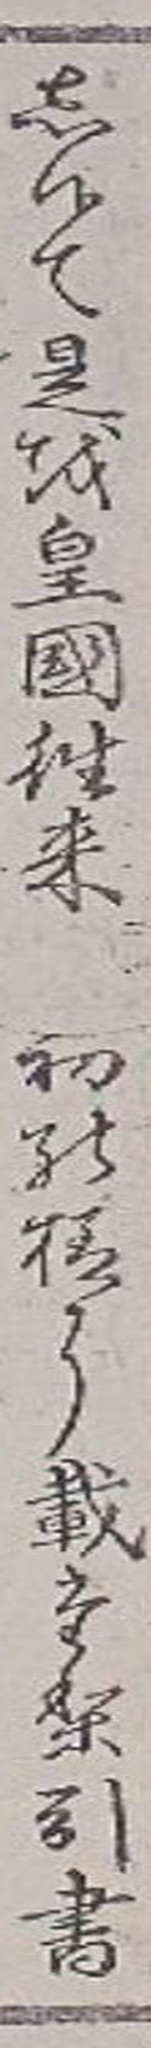し候て是を皇国往来初の様に載たり引書
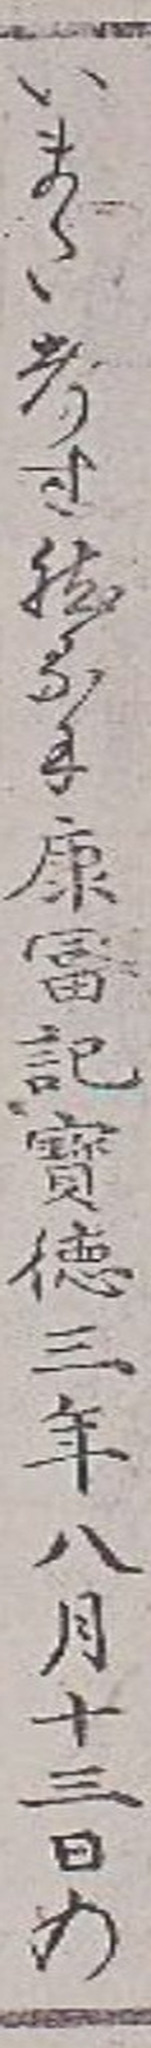いまた考す然るに康冨記宝徳三年八月十三日の
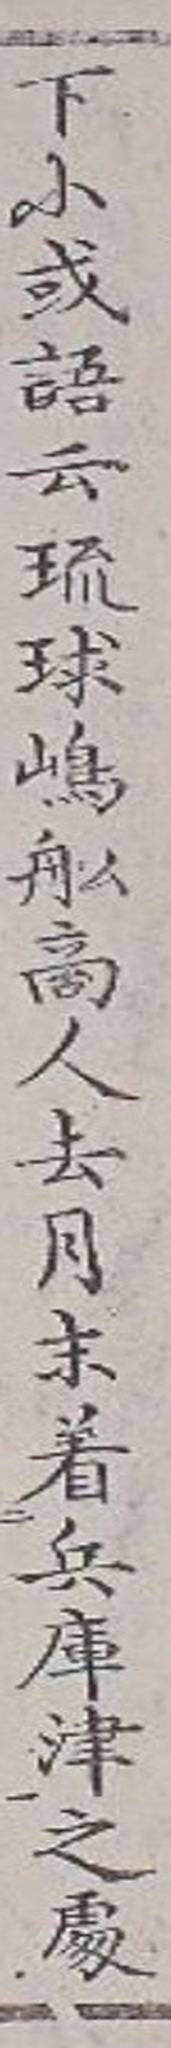下に或語云琉球島船商人去月未着兵庫津之処
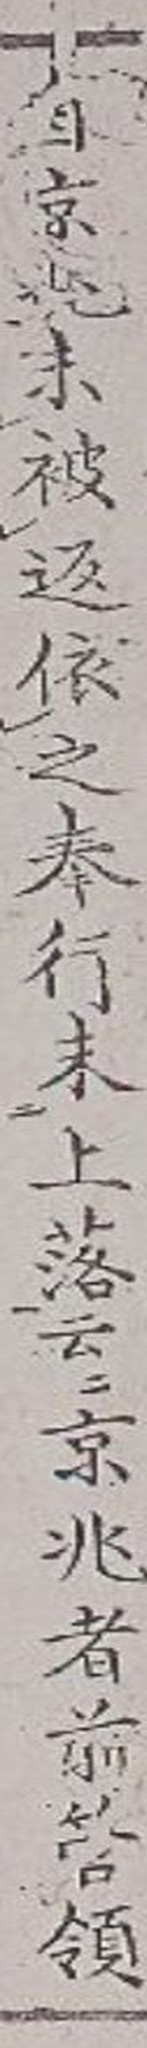有京兆未被返依之奉行未上落云京兆は前管領
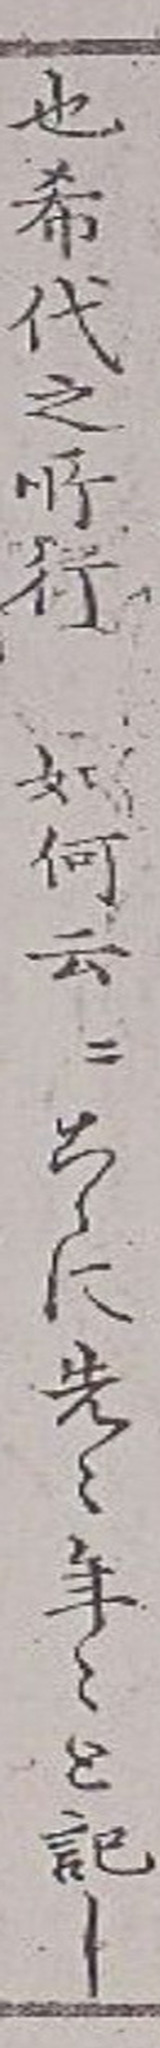也希代之所業如何云ゝに先々年々と記し
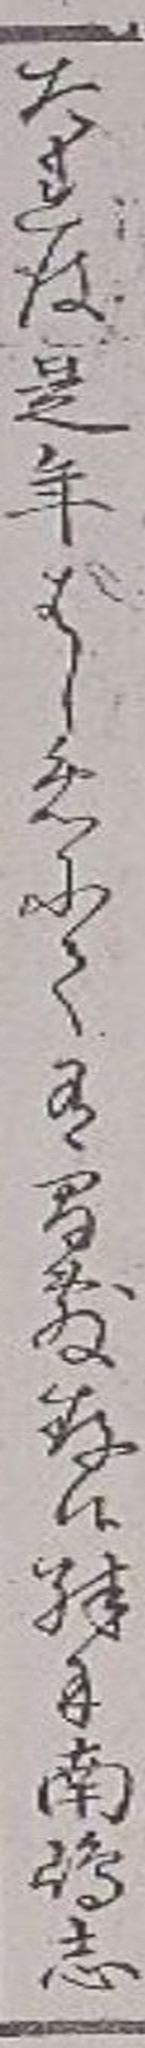たれは是年はしめにて有間敷存候殊に南島志

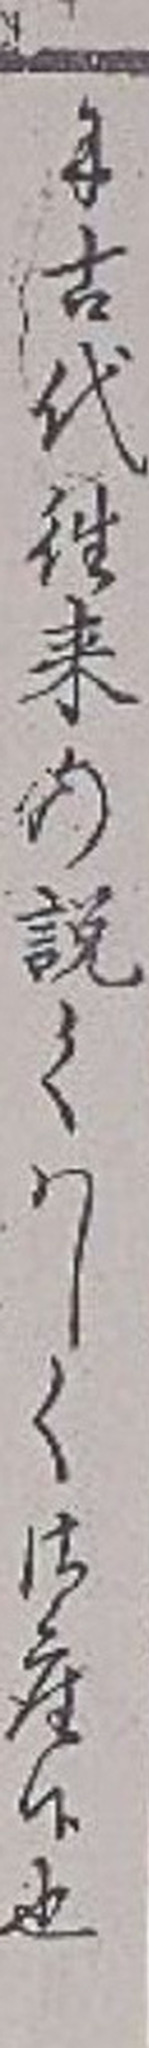に古代往来の説くはしく御座候也
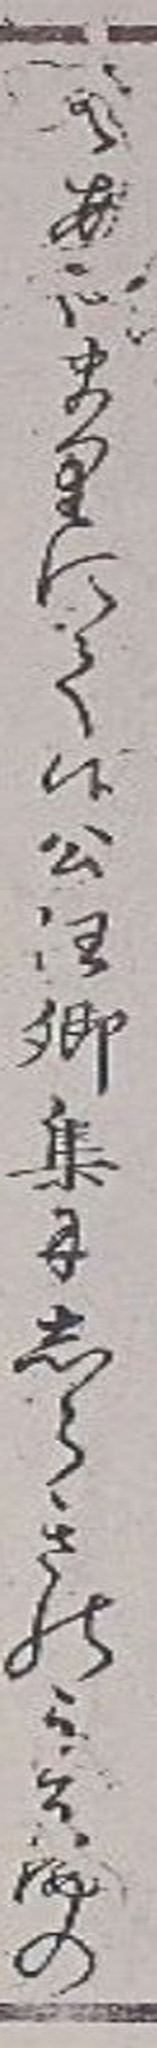はあやまりにて候公任郷集にしらきのうるまの
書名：琉球状
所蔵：University of the Ryukyus Library
